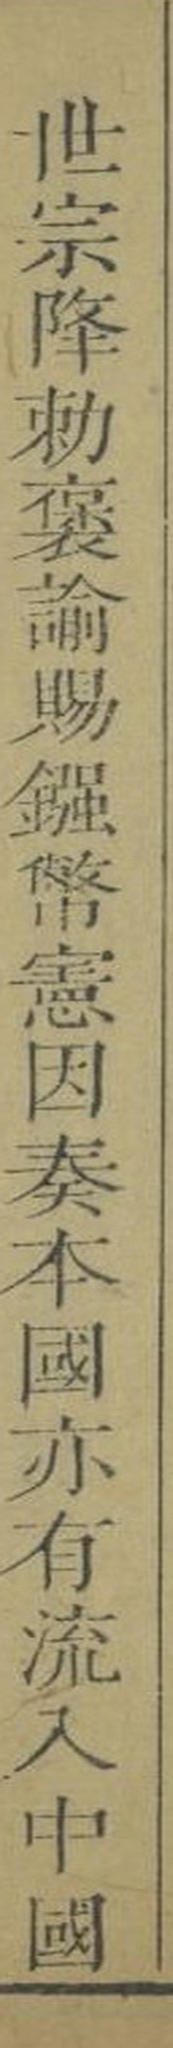世宗降勅褒諭賜鏹幣憲因奏本国亦有流入中国
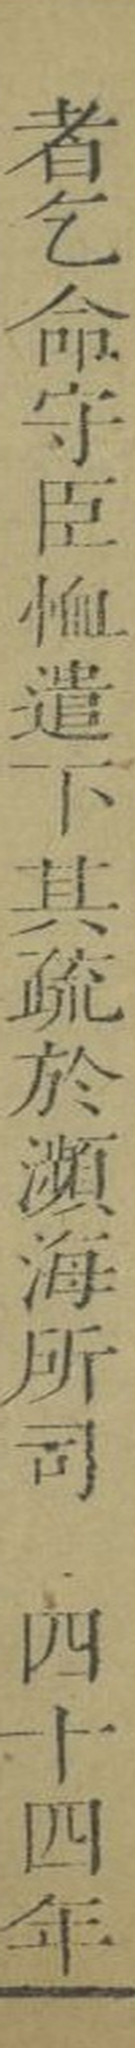者乞命守臣恤遣下其疏於瀕海所司四十四年
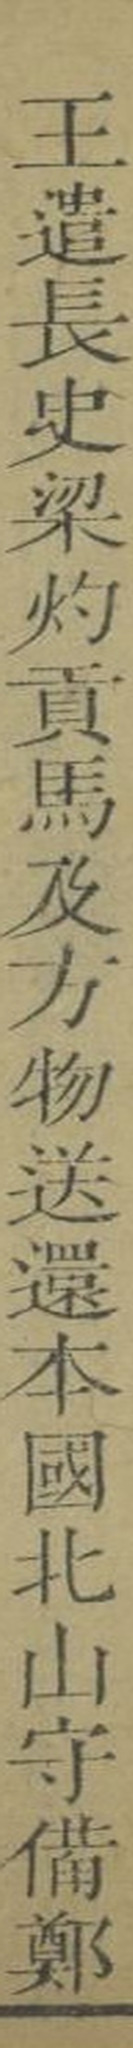王遣長史梁灼貢馬及方物送還本国北山守備鄭
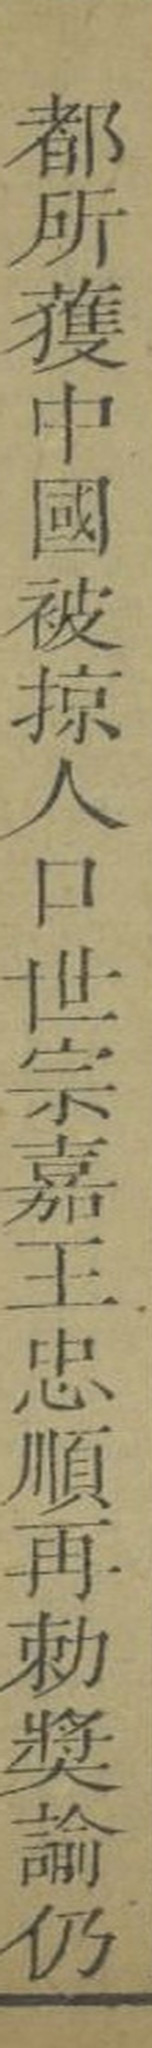都所獲中国被掠人口世宗嘉王忠順再勅奨諭仍
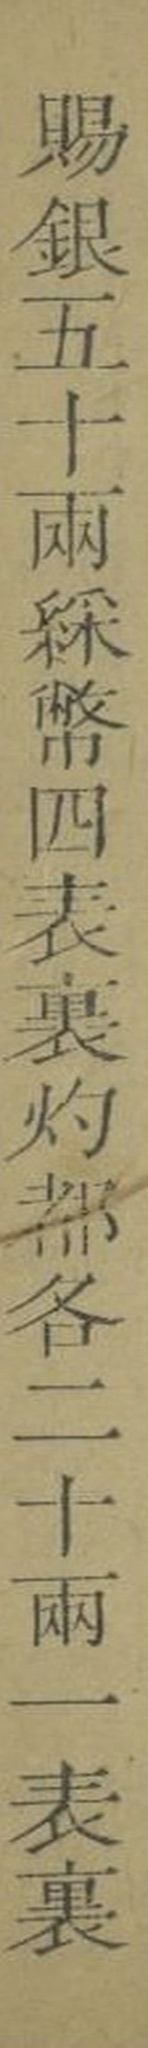賜銀五十両綵幣四表裏灼都各二十両一表裏
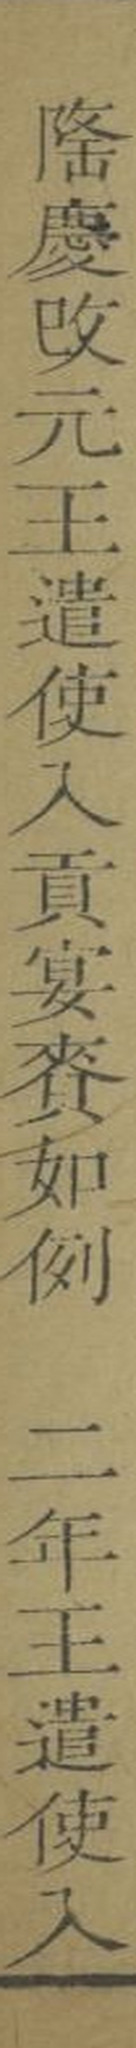慶改元王遣使入貢宴賚如例二年王遣使入

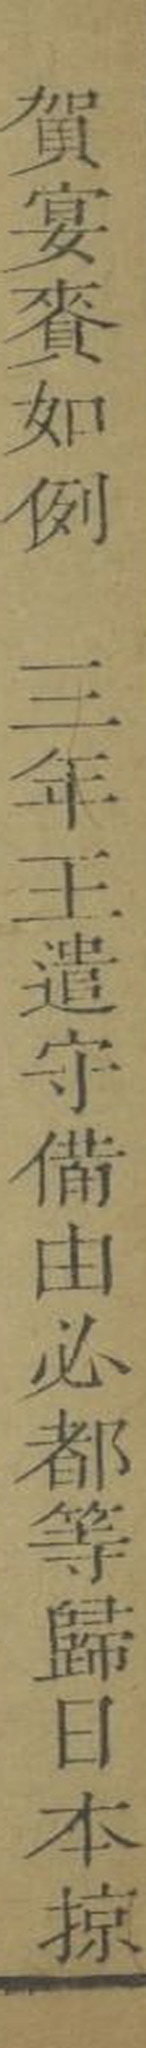賀宴賚如例三年王遣守備由必都等帰日本掠
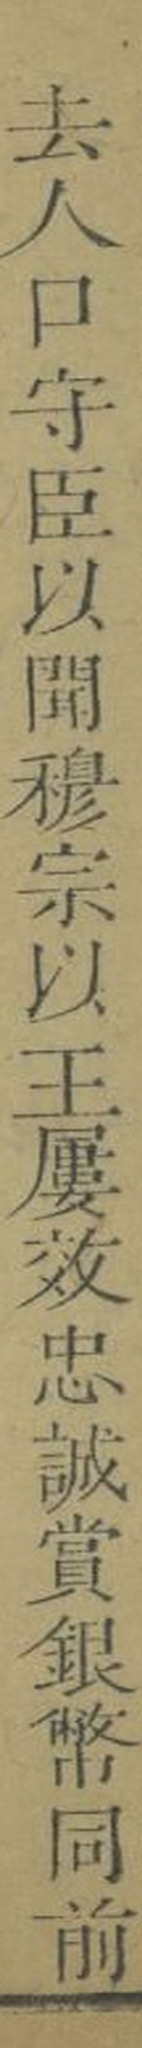去人口守臣以聞穆宗以王屢效忠誠賞銀幣同前
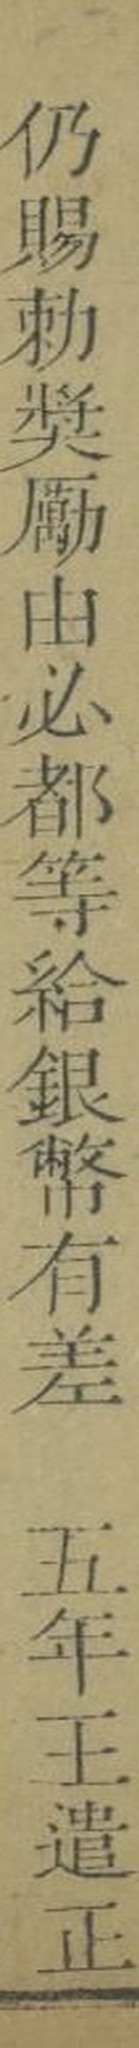仍賜勅奨励由必都等給銀幣有差五年王遣正
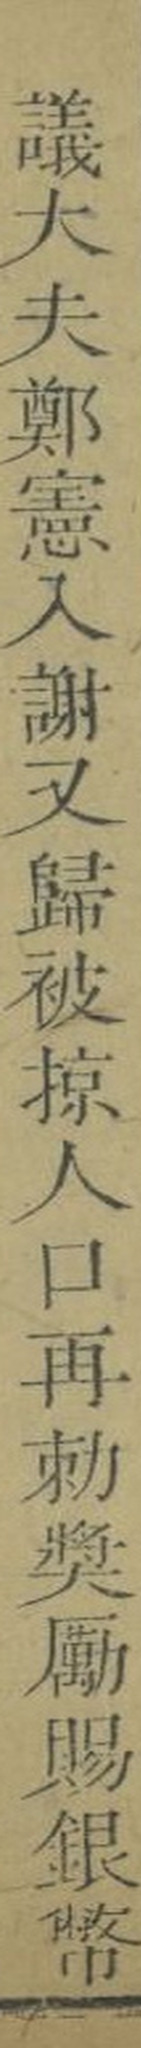議大夫鄭憲入謝又帰被掠人口再勅奨励賜銀幣
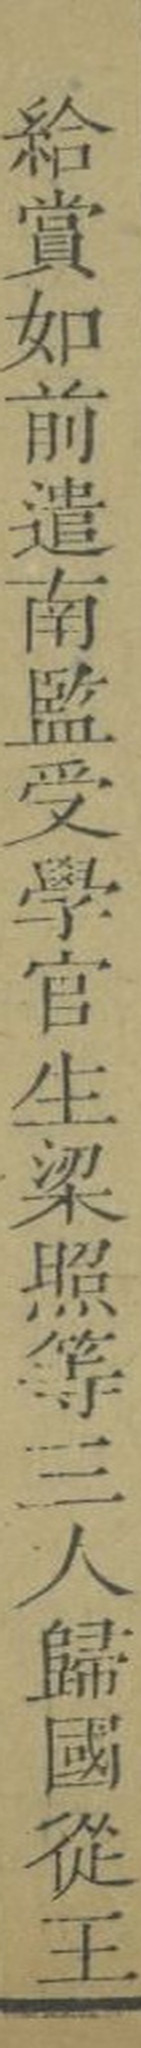給賞如前遣南監受学官生梁照等三人帰国従王
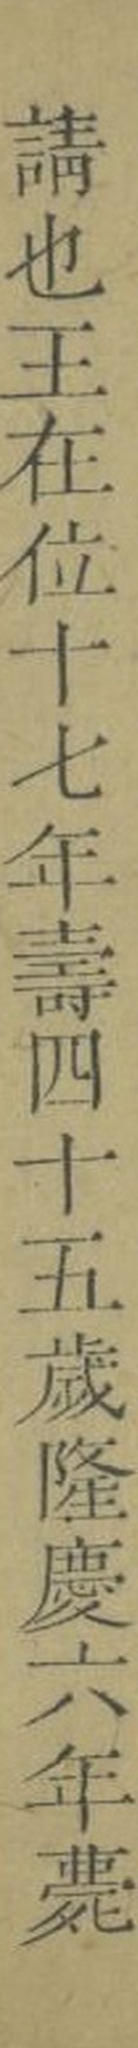請也王在位十七年寿四十五歳隆慶六年薨
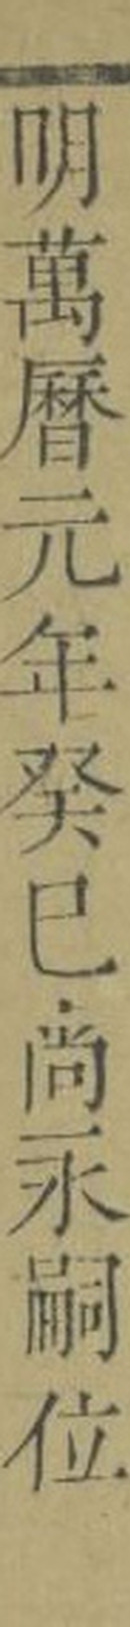明万暦元年癸巳尚永嗣位
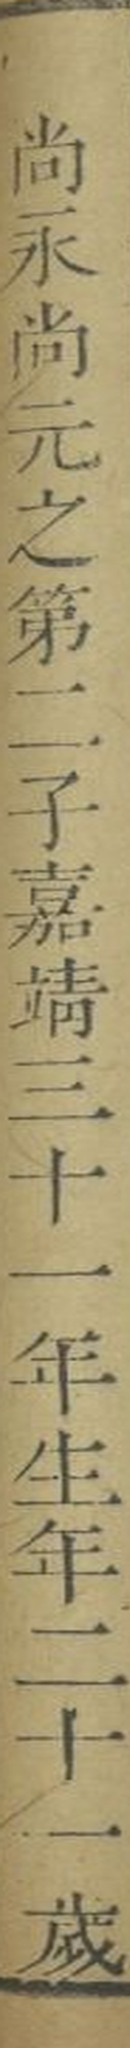尚永尚元之第二子嘉靖三十一年生年二十一歳
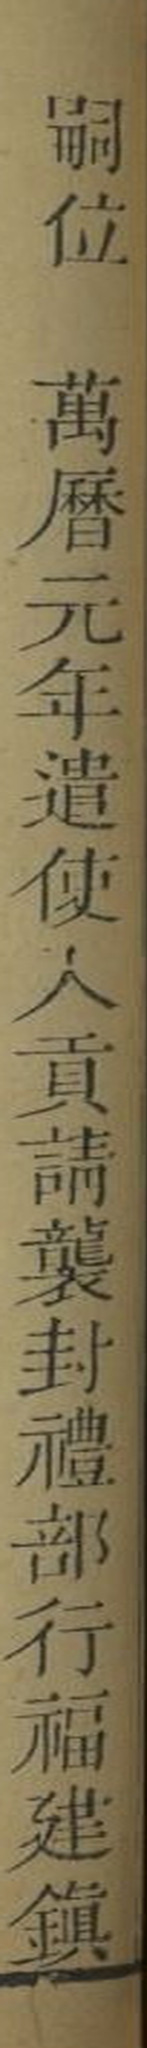嗣位万暦元年遣使入貢請襲封礼部行福建鎮
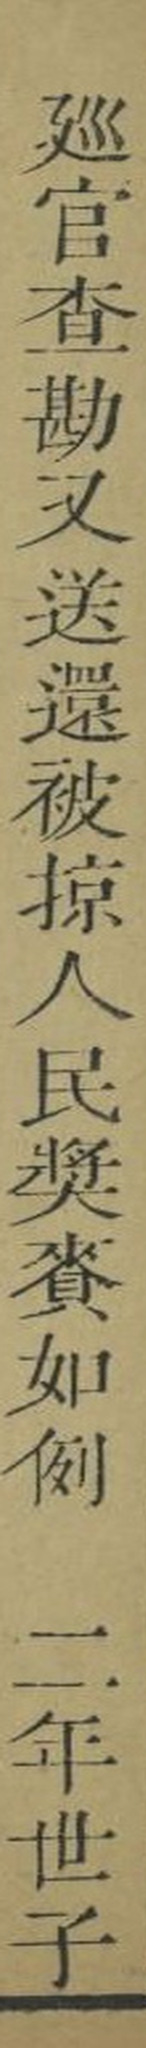巡官査勘又送還被掠人民奨賚如例二年世子
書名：中山伝信録 巻三
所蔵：University of the Ryukyus Library
